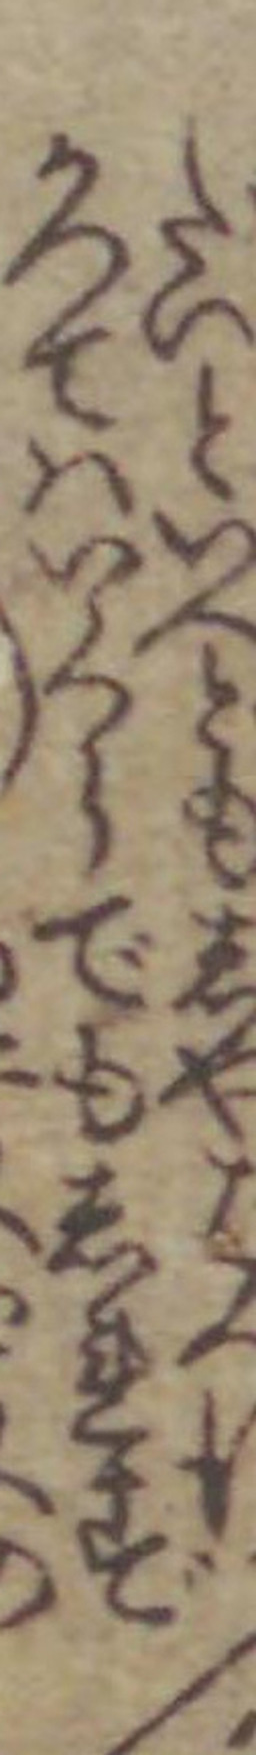かつてはいくらでもしれず
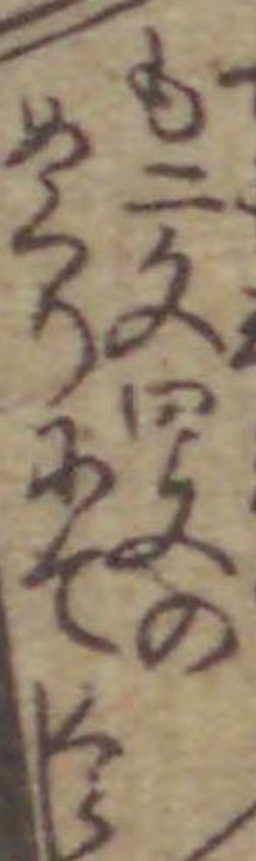めくりにてくらし

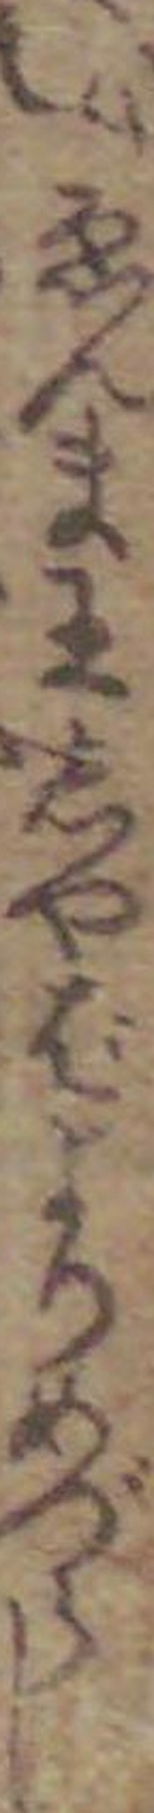ゑんま王しやばよりめづらし
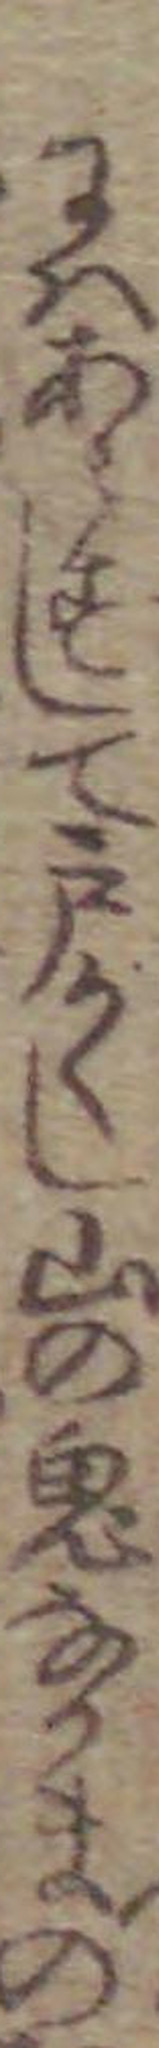にはあらずして戸かくし山の鬼なかまのむすめ
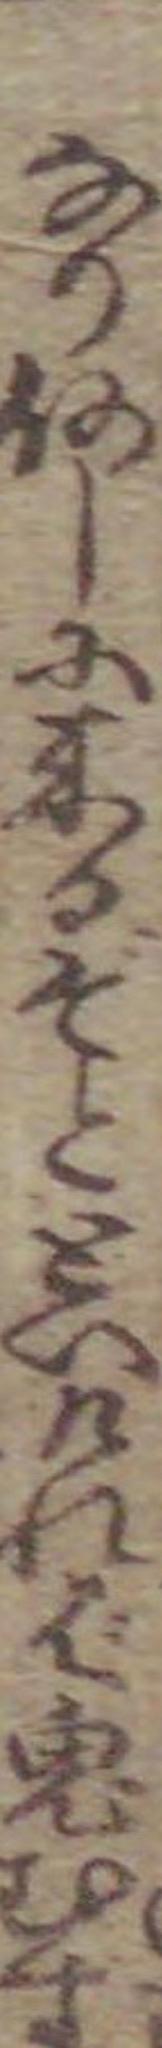なり何しに来るぞとといければ鬼むすめしか
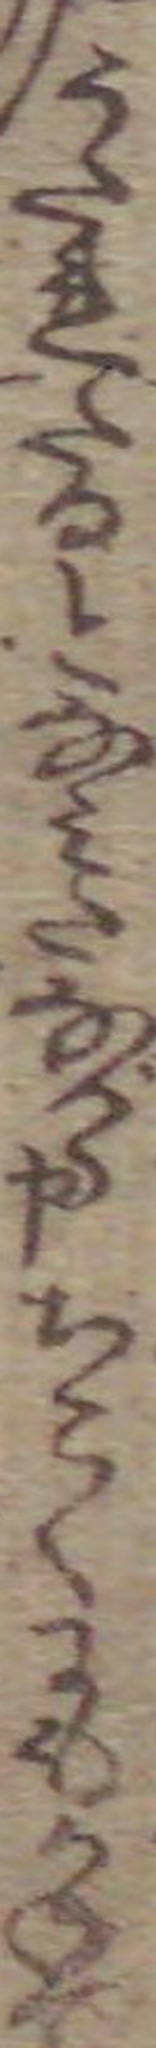うたれたるとなみたながら申ちこくにもかねで
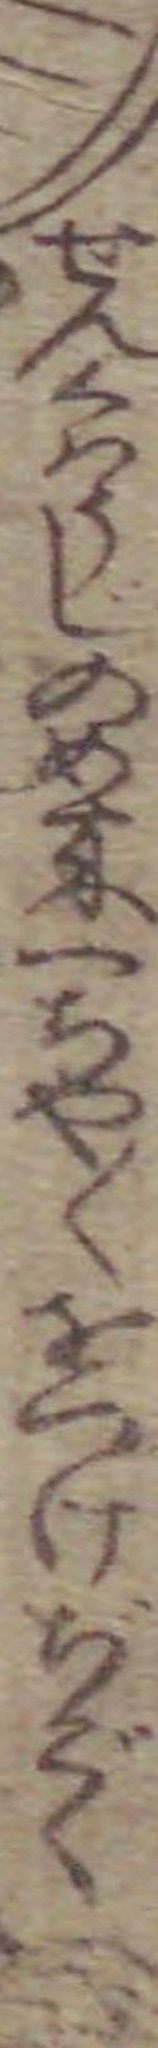ぜんくわうしの如来へちや〳〵をつけぢごく
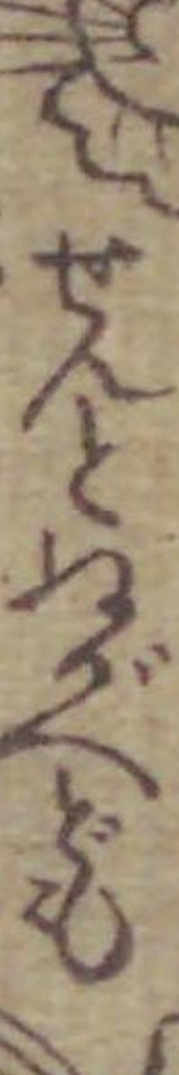せんとねがへども
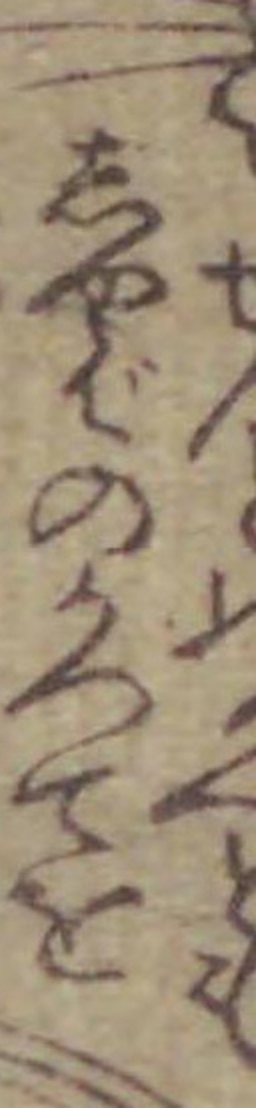しやばのかつてを
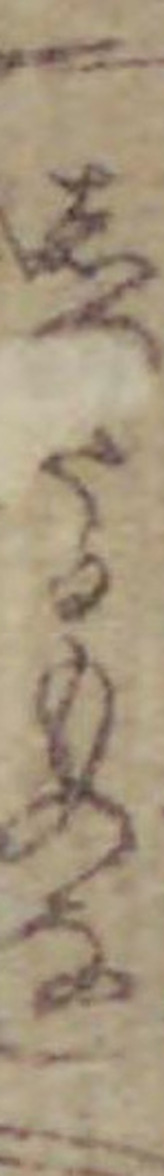しつたるものなし
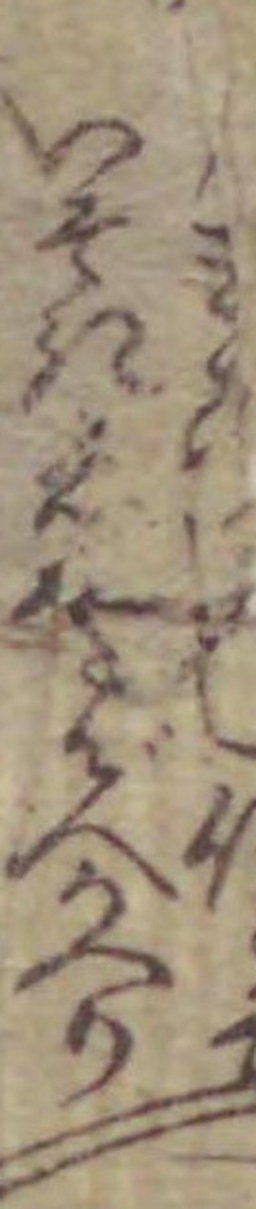いそきしやばへかへり
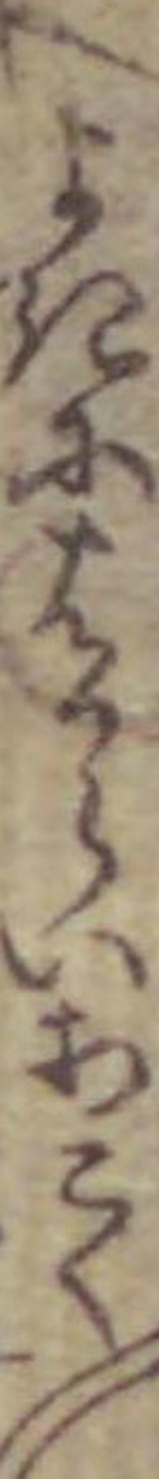よきにはからいちこく
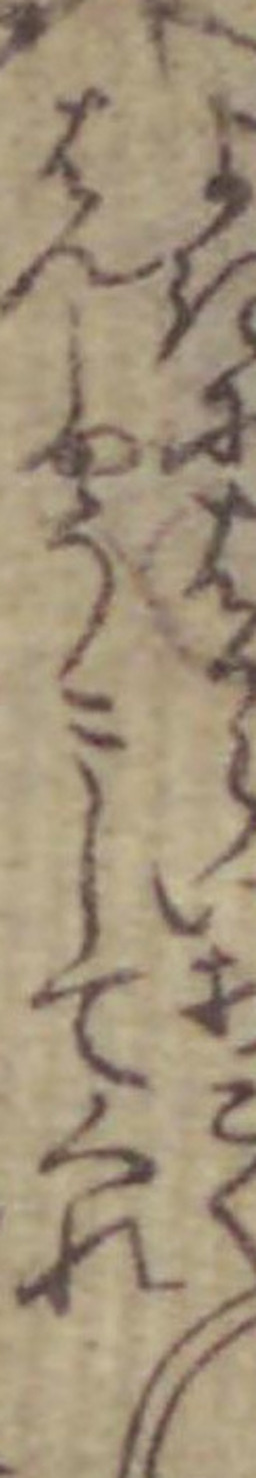はんしやうにしてくれ
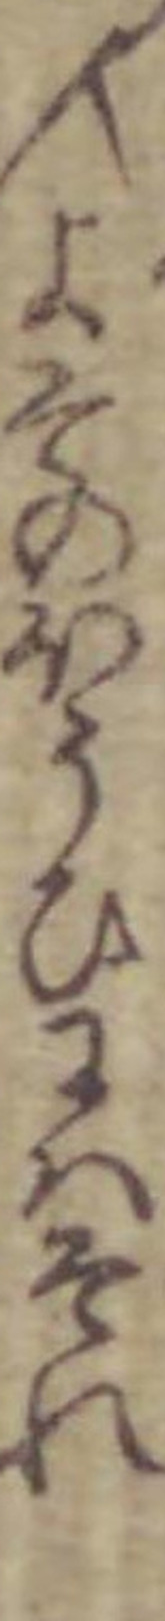よそのほうひにはそれ
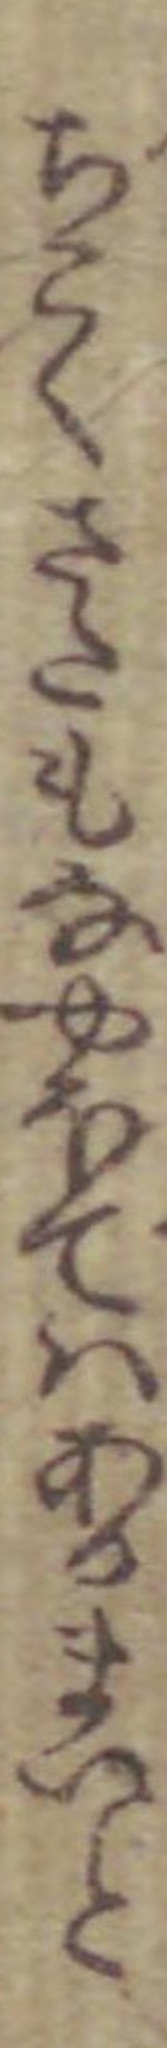ちこくさたもなやほてはあるまいと
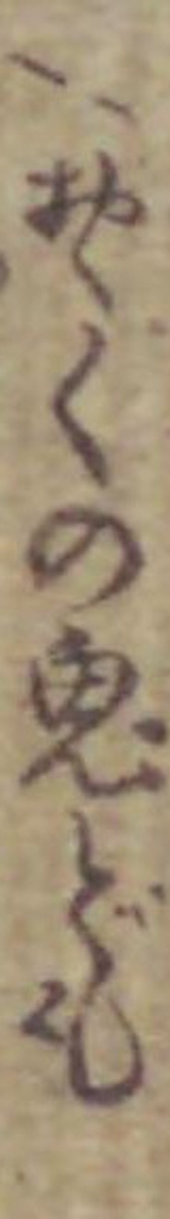おゝくの鬼ども
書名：鬼の趣向草 2巻
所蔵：国立国会図書館 National Diet Library, JAPAN
